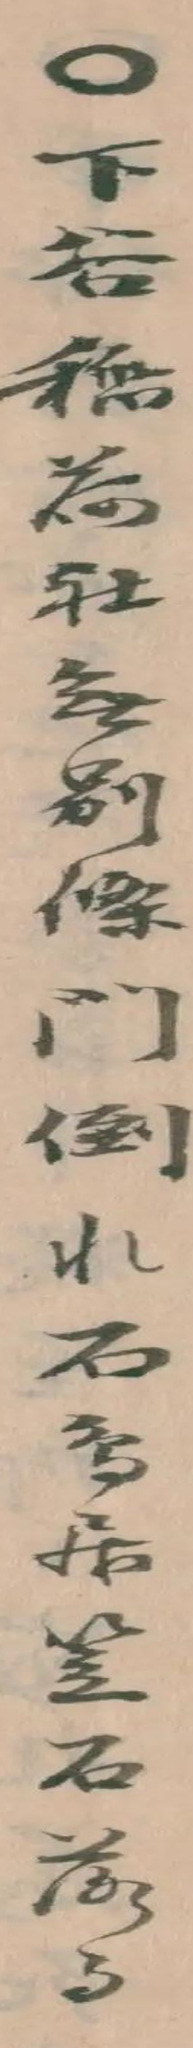〇下谷稲荷社無別條門倒れ石鳥居笠石落る
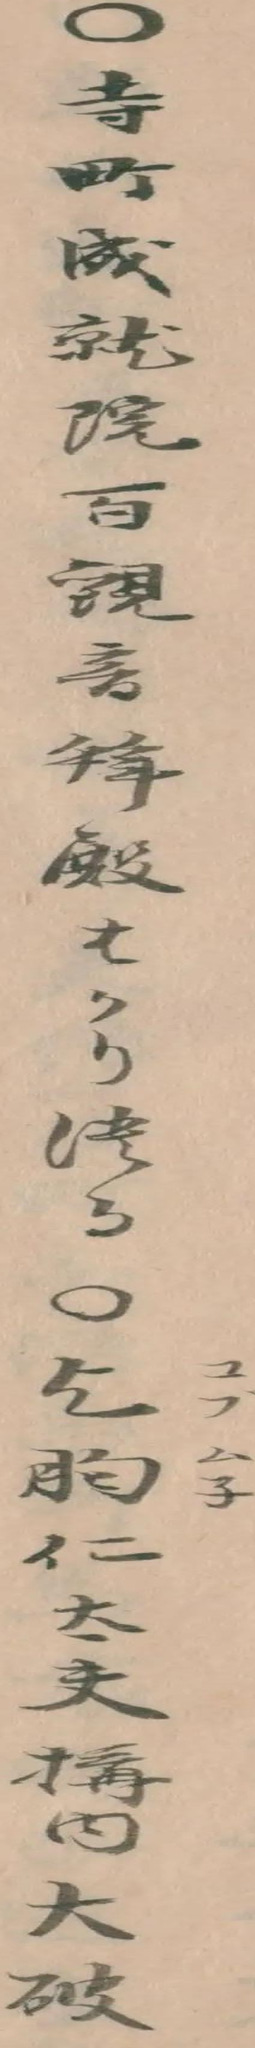〇寺町成就院百観音拝殿はかり潰る〇乞胸仁太夫構内大破
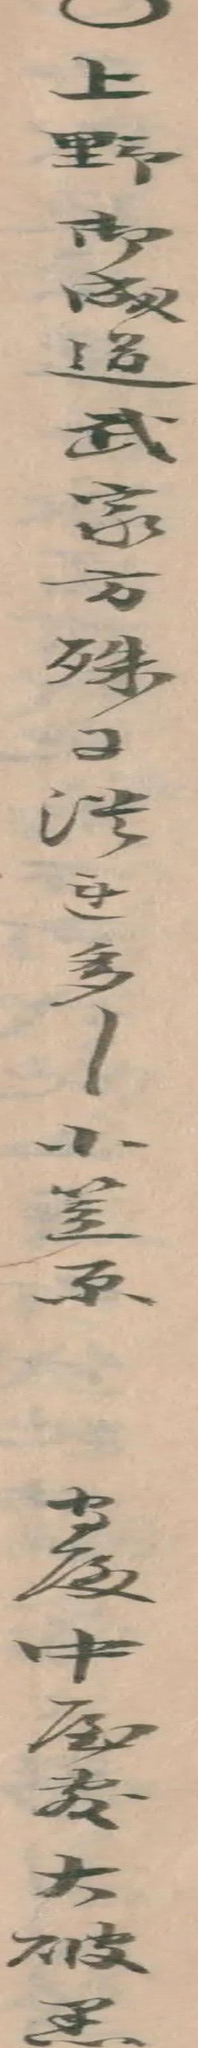〇上野御成道武家方殊に潰れ多し小笠原守殿中屋敷大破黒
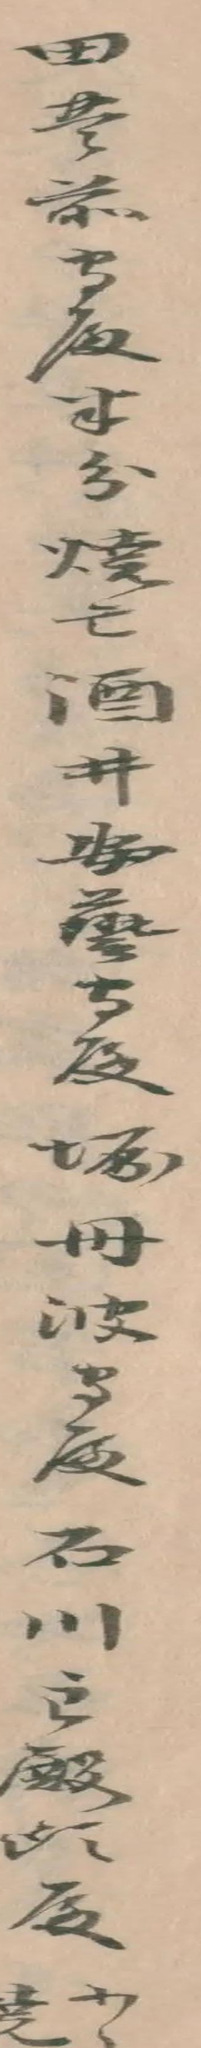田豊前守殿半分焼亡酒井安芸守殿堀丹波守殿石川主殿頭殿少し焼
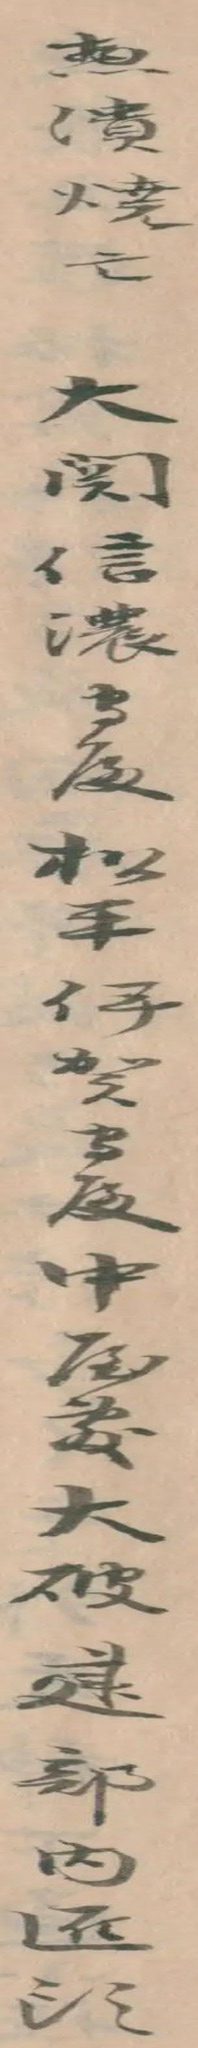惣潰焼亡大関信濃守殿松平伊賀守殿中屋敷大破建部内匠頭

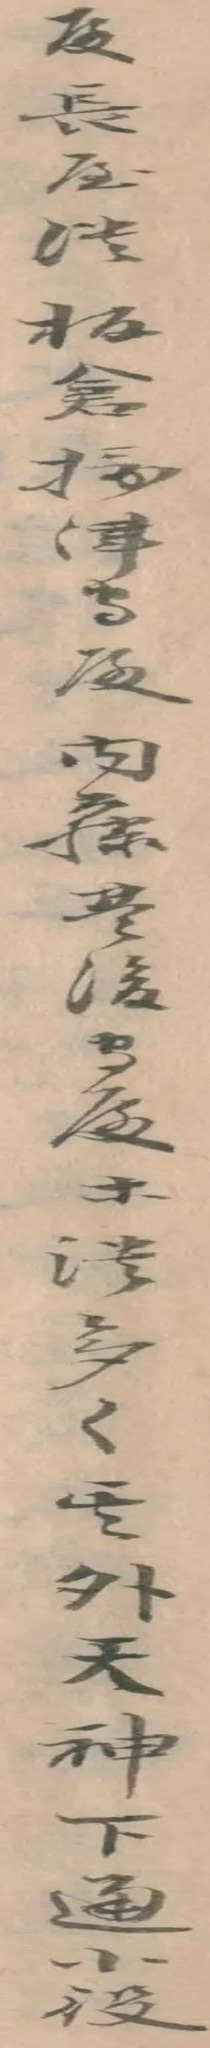殿長屋潰板倉摂津守殿内藤豊後守殿等潰多く其外天神下通小役
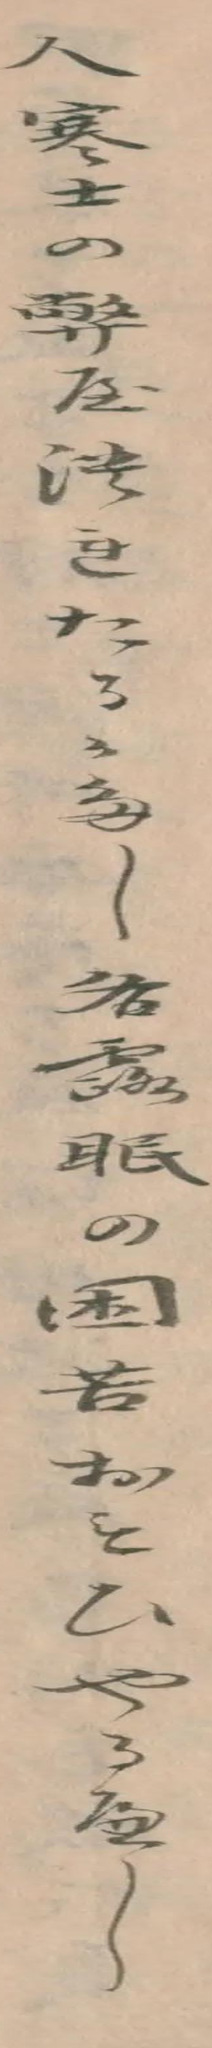人寒士の弊屋潰れたるか多し各露眠の困苦おもひやるへし
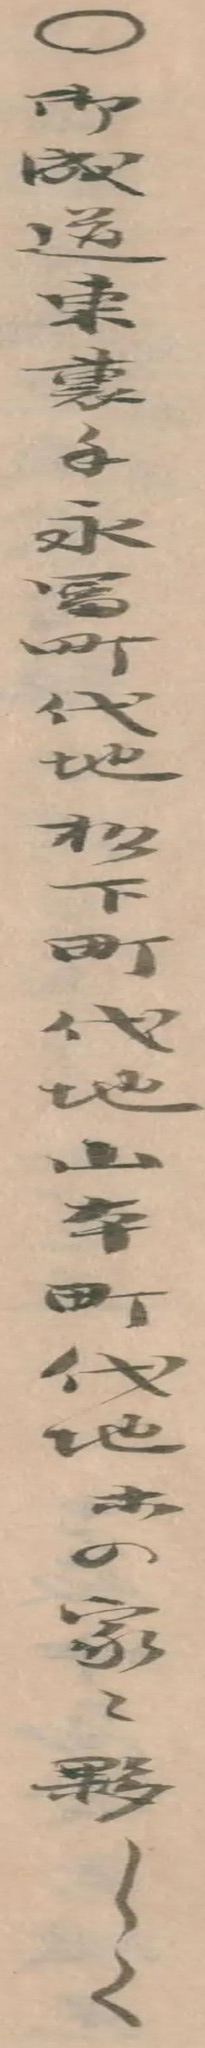〇御成道東裏手永富町代地松下町代地山本町代地等の家々夥しく
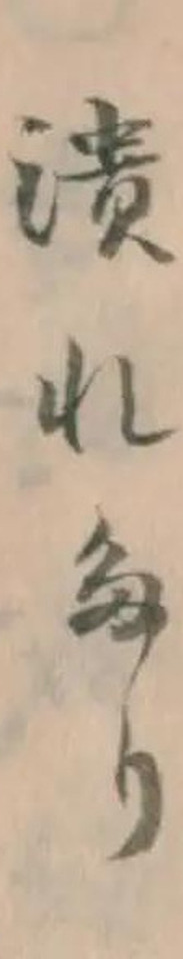潰れたり
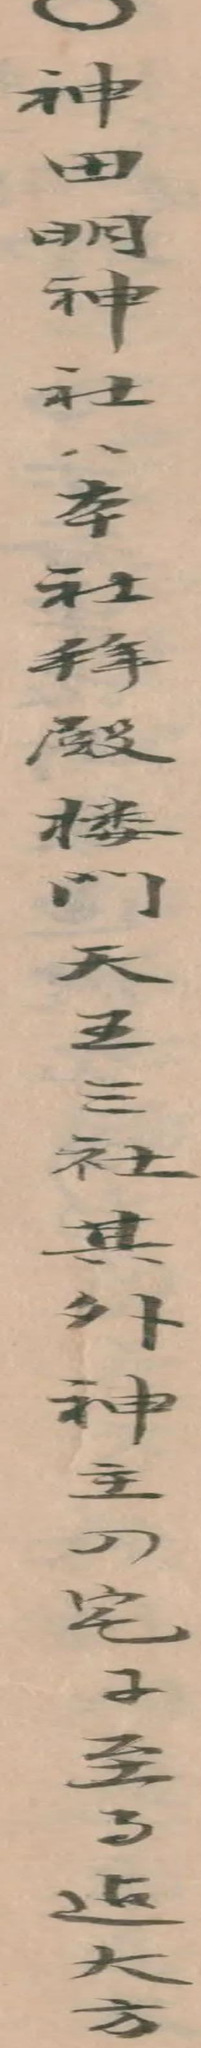〇神田明神社は本社拝殿楼門天王三社其外神主の宅に至る迄大方
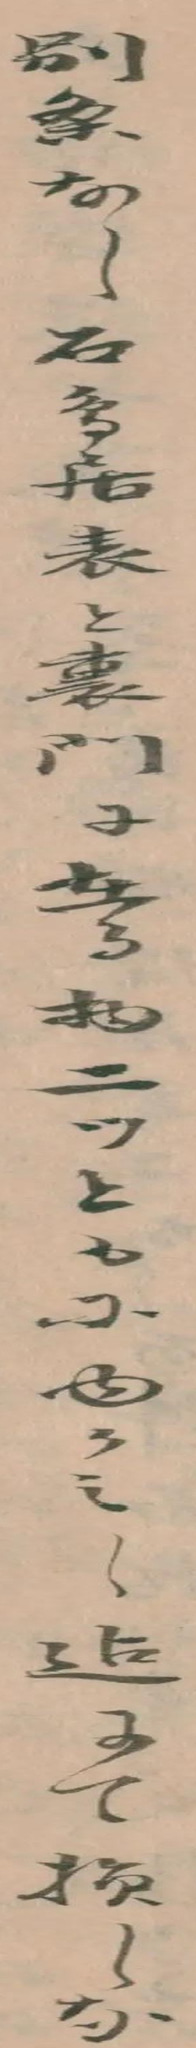別条なし石鳥居表と裏門に在る物二ッともにゆかみし迄にて損しな
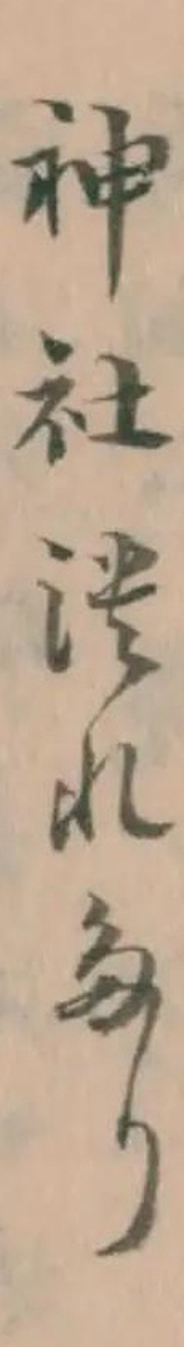神社潰れたり
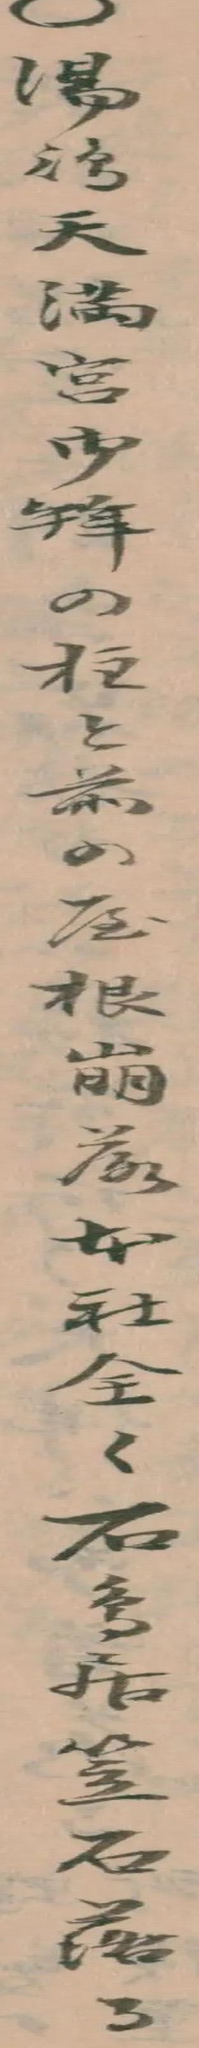〇湯島天満宮御拝の柱と前の屋根崩落本社全く石鳥居笠石落る
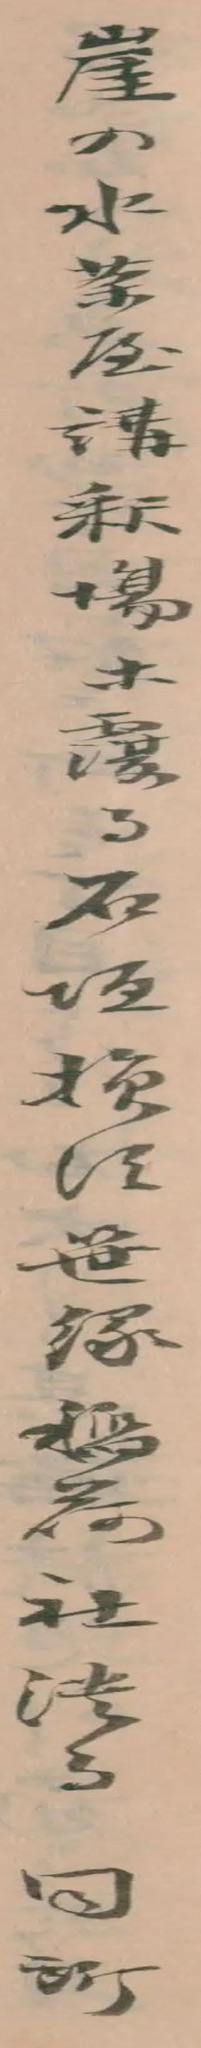崖の水茶屋講釈場等覆る石垣損す笹縁稲荷社潰る同所
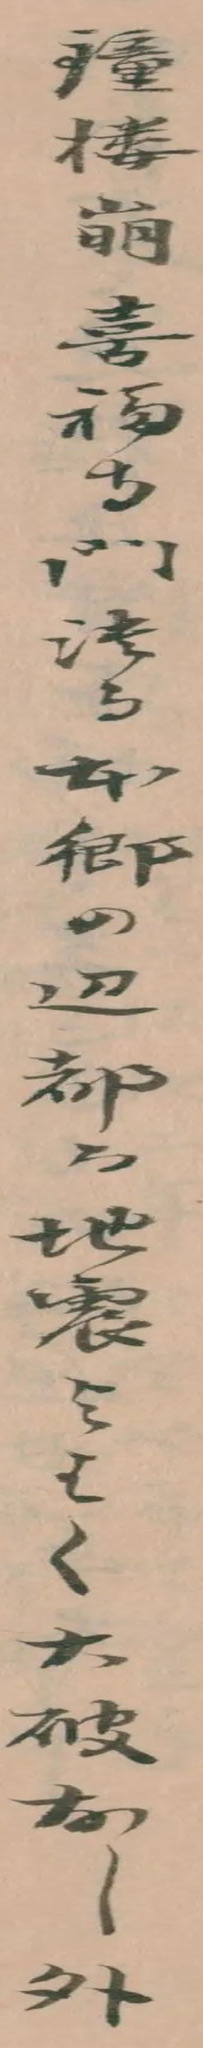鐘楼崩喜福寺門潰る本郷の辺都而地震よはく大破なし外
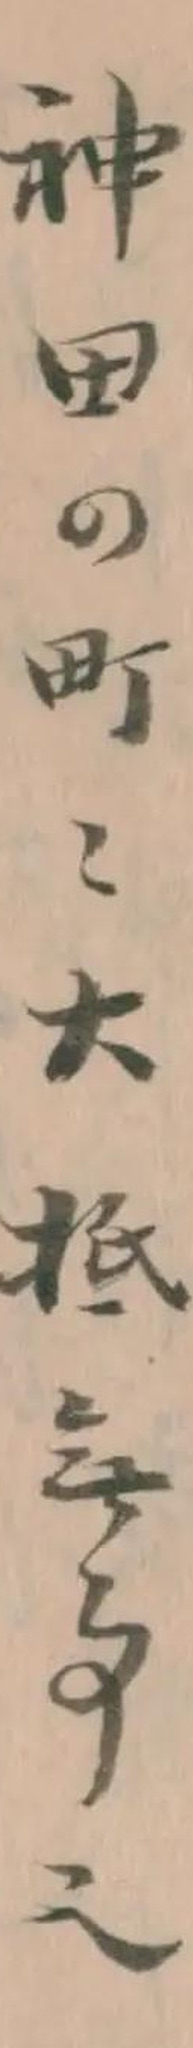神田の町々大抵無事也
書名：地災撮要. 巻7-9(地震之部)
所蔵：国立国会図書館 National Diet Library, JAPAN
